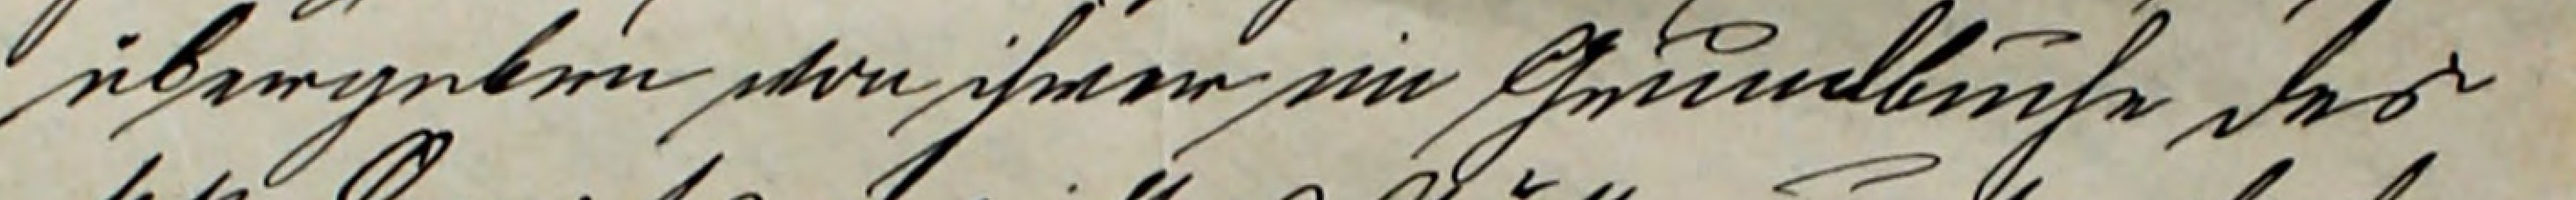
übergaben von ihrer ein Grundbuche des
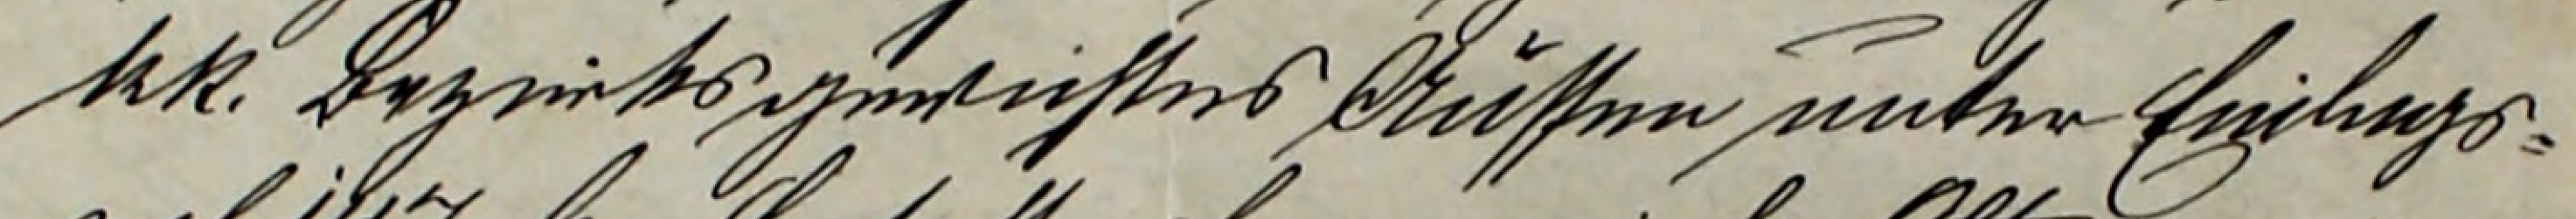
kk. Bezirksgerichtes Aussee unter Einlags=
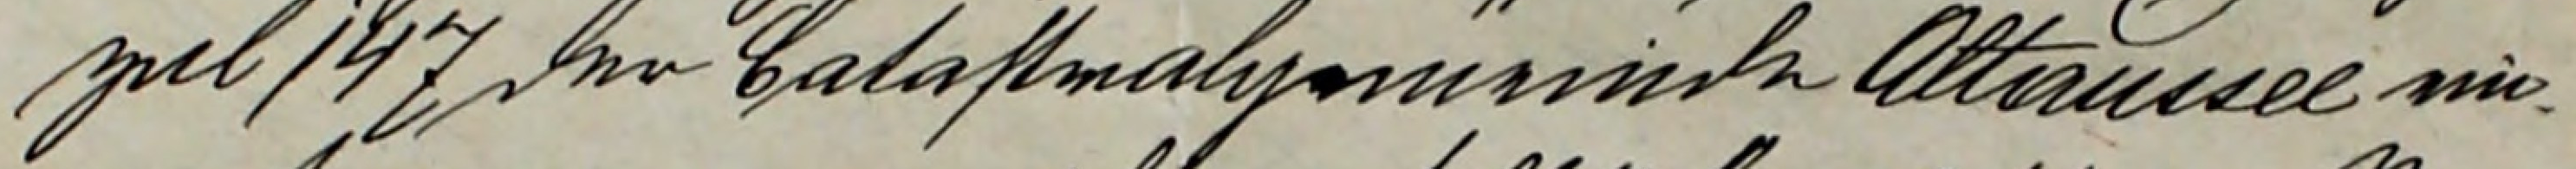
zal 147 der Catastralgemeinde Altaussee ein=
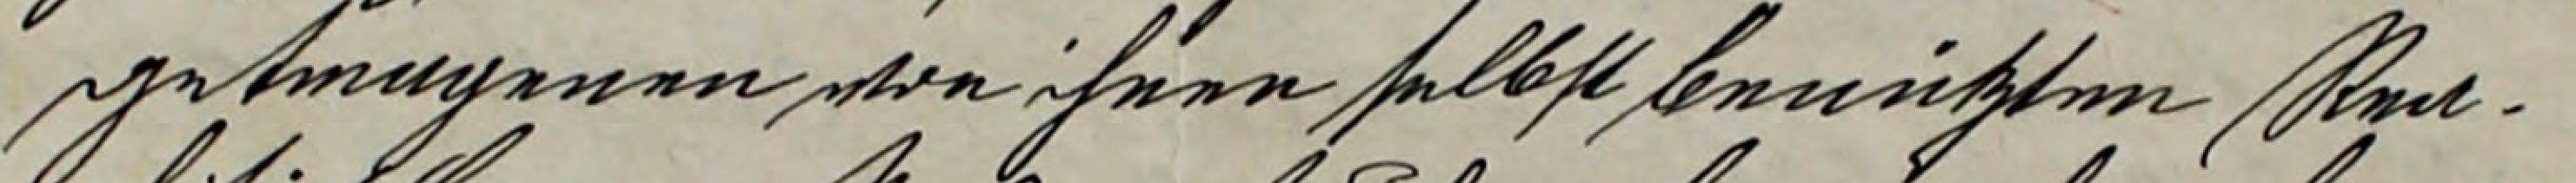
getragenen von ihnen selbst benützten Rea
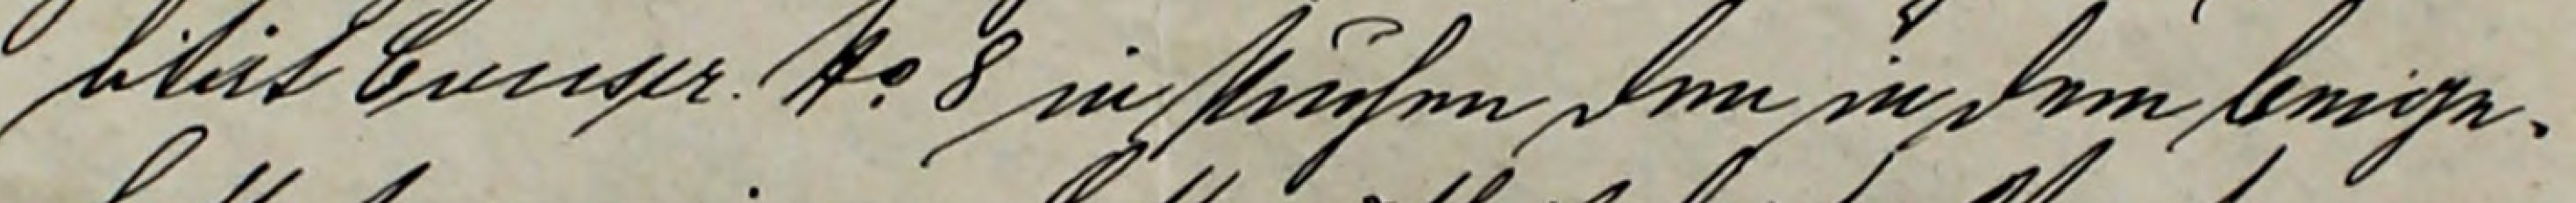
lität Canser. No 8 in Puchen den in dem beige
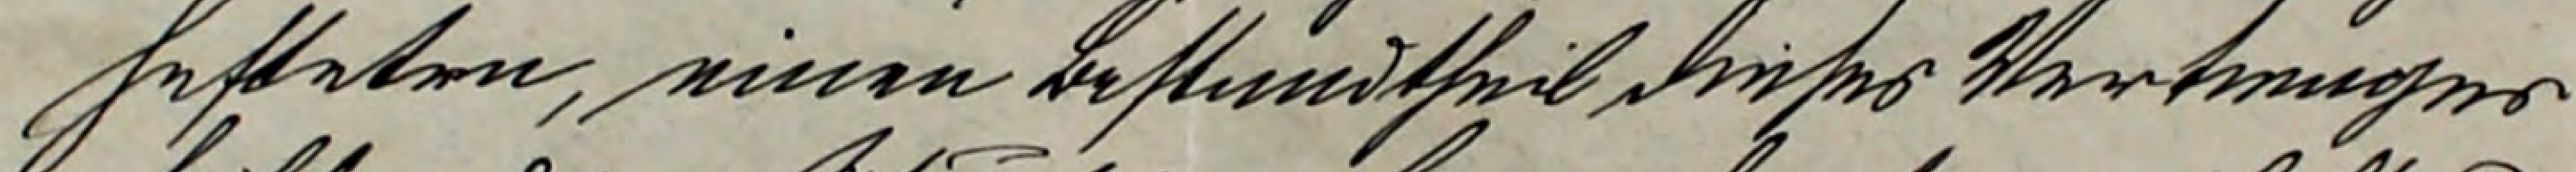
hefteten, einen Bestandtheil dieses Vertrages
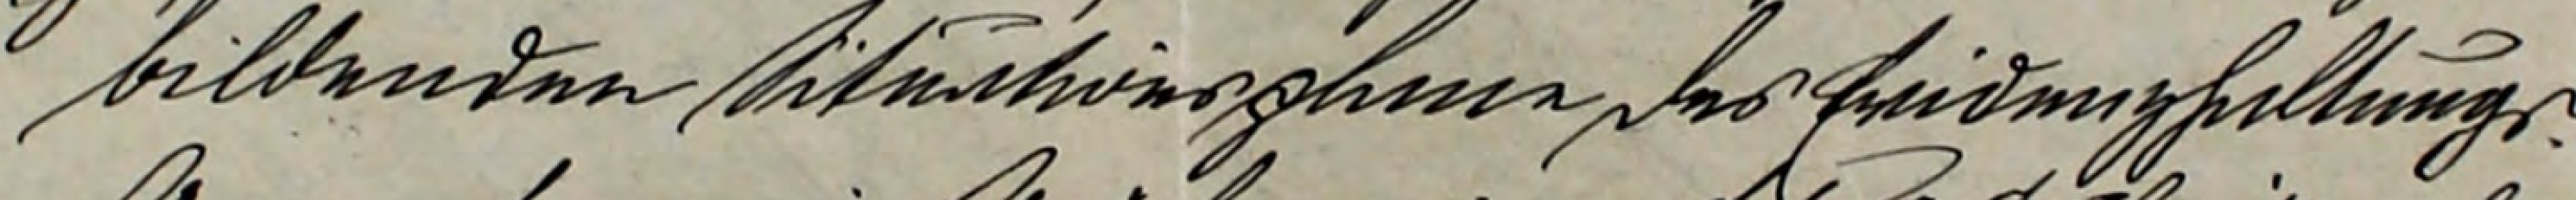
bildenden Situnhönsghme das Evidenzhaltungs.
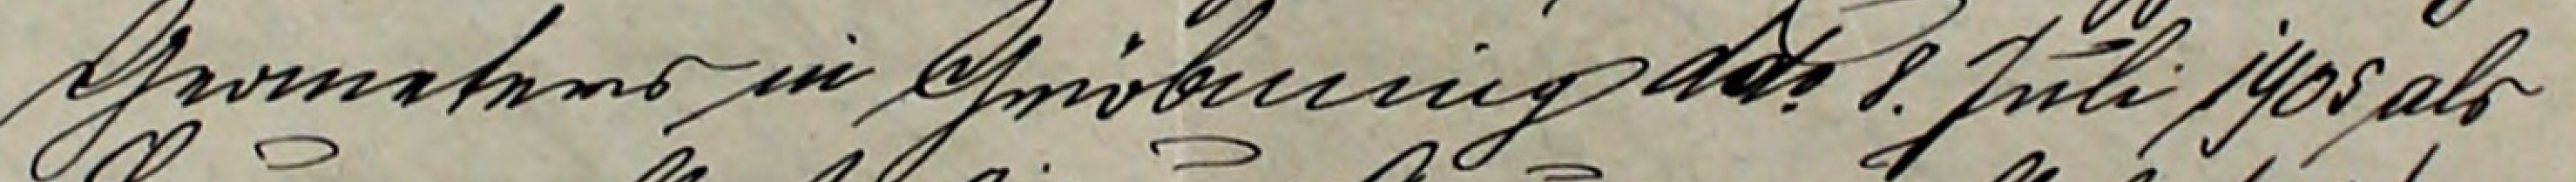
Geometers in Gröbming ddo 8. Juli 1905 als
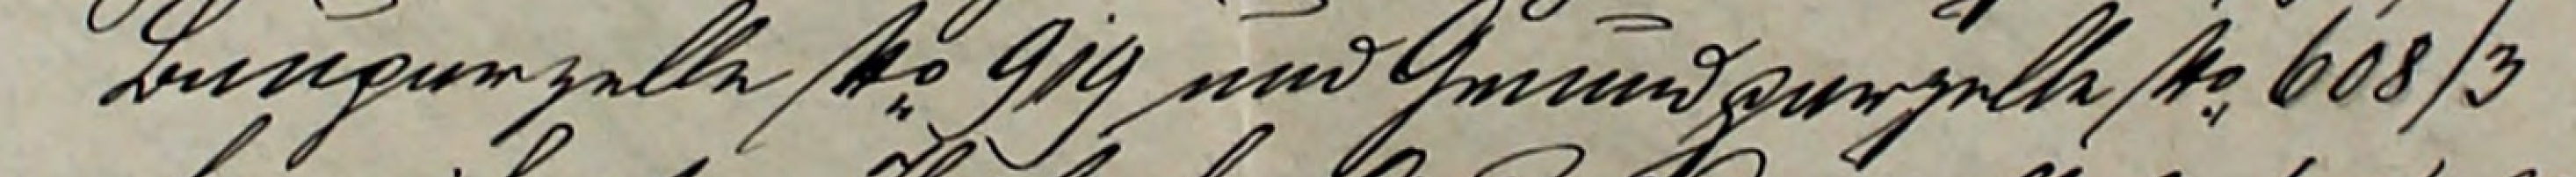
Bauparzelle No 919 und Grundparzelle No 608/3
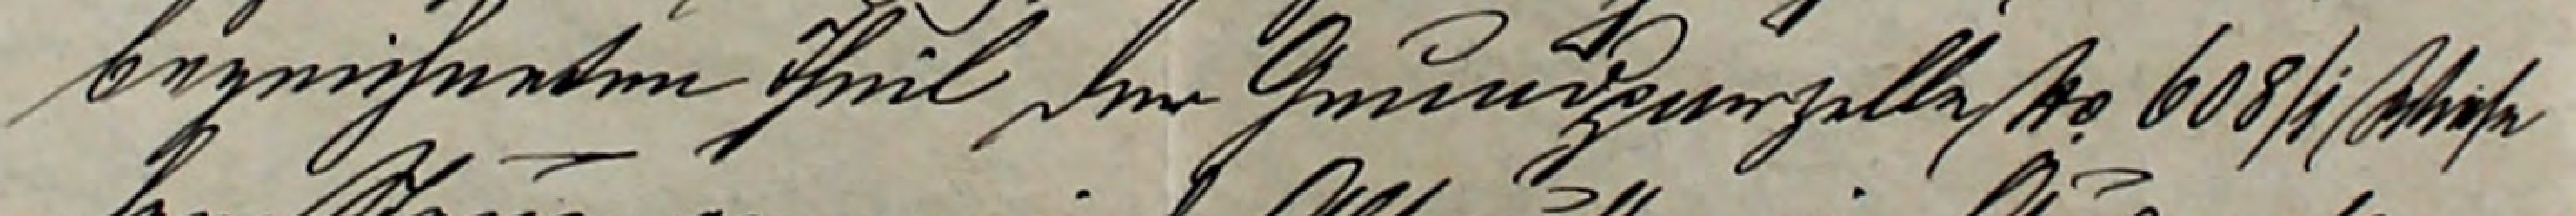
bezeichneten Theil der Grundparzelle No 608/1 Wiese
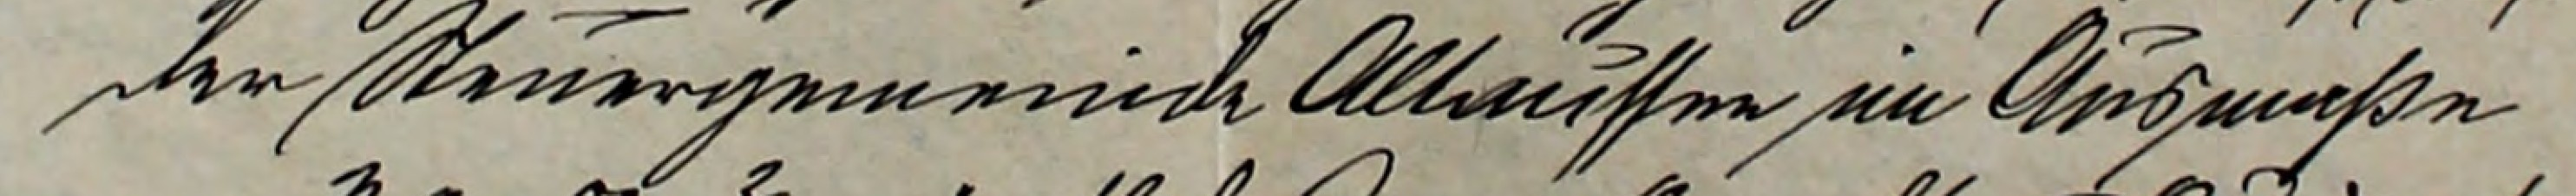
der Steuergemeinde Altaussee im Ausmaße
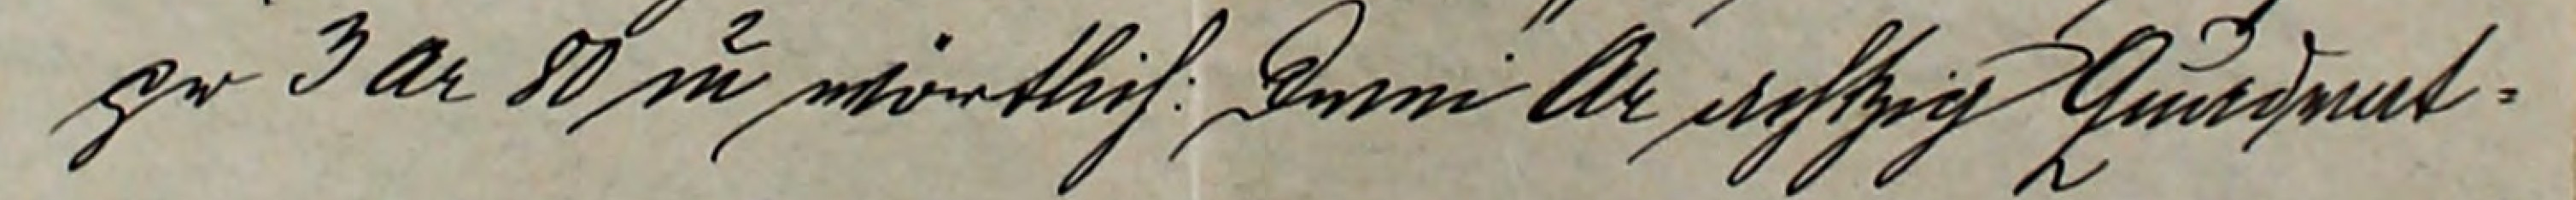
pr 3 Ar 80 m2 wörtlich: drei Ar Achtzig Quadrat=
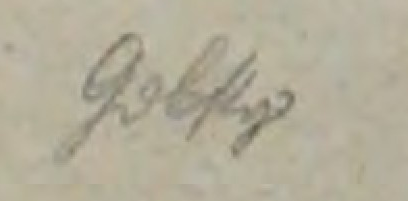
Gobstg
